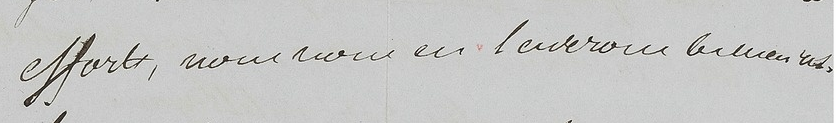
efforts, nous nous en laverons les mains.
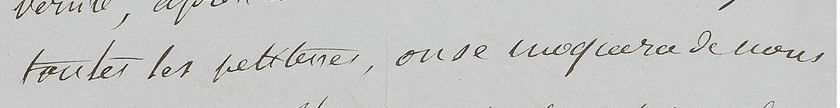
toutes les petitesses, on se moquera de nous
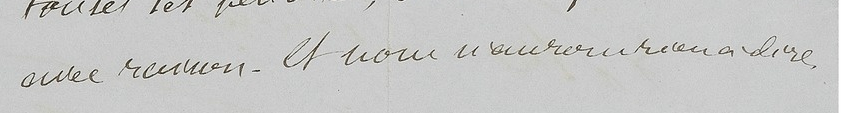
avec raison. Et nous n'aurons rien à dire.
